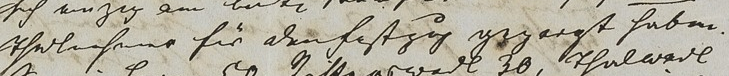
Theilnehmer für den Festzug gezeigt haben.
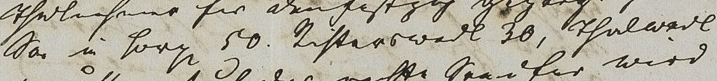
So in Horgen 50. Richtersweil 30, Thalweil
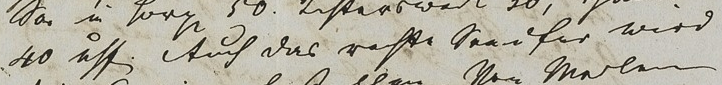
40 usf. Auch das rechte Seeufer wird
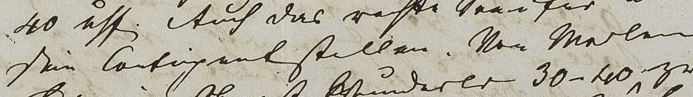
sein Contingent stellen. Von Meilen
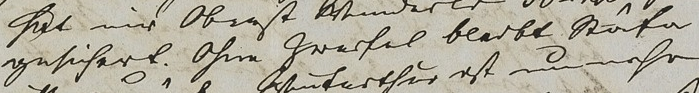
gesichert. Ohne Zweifel bleibt Stäfa
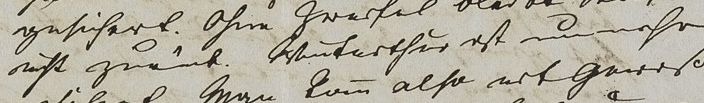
nicht zurück. Winterthur ist nunmehr
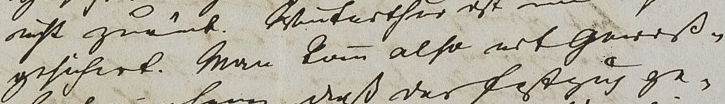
gesichert. Man kann also mit Gewiß-
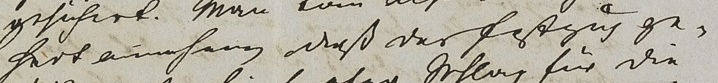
heit annehmen, daß der Festzug ge-
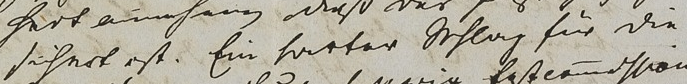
sichert ist. Ein harter Schlag für die
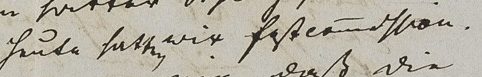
Heute hatten wir Festcommission.
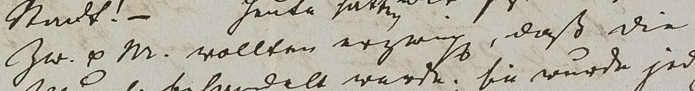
Zw. & M. wollten erzwingen, daß die
